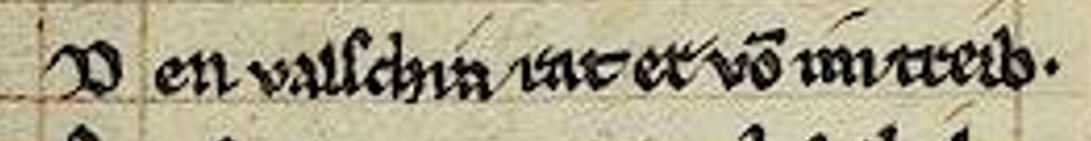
Den valſchin rat er vo(n) im treib.
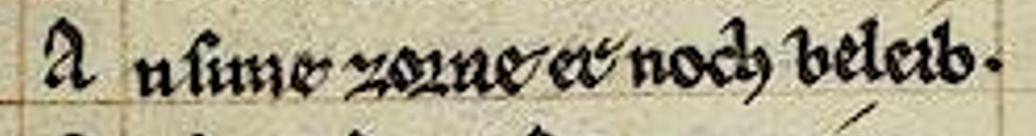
An ſime zorne er noch beleib.
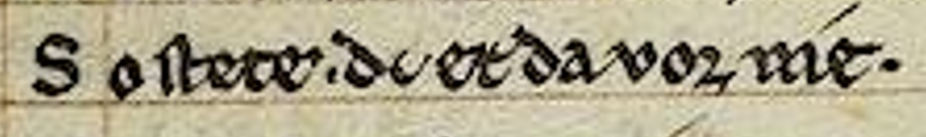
So ſtete. d(az) er da vor nie.
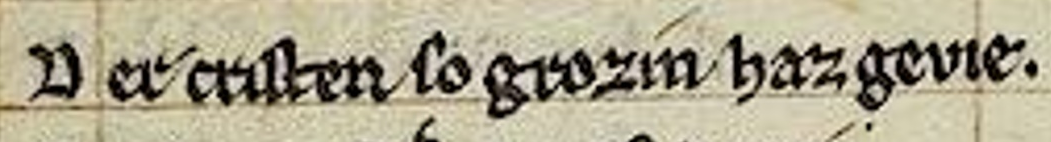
Der criſten ſo grozin haz gevie.
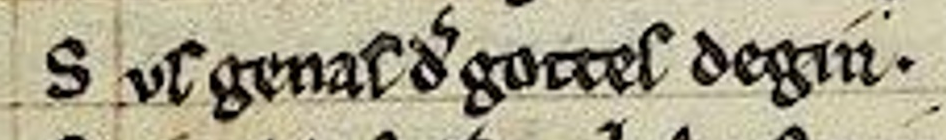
Svſ genaſ d(er) gotteſ degin.
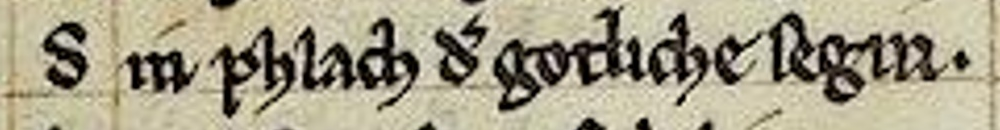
Sin phlach d(er) gotliche ſegin.
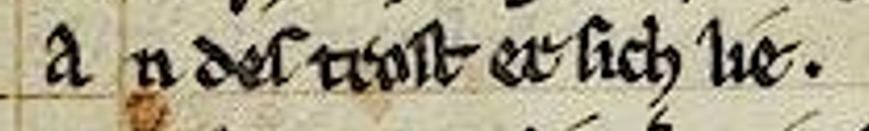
An deſ troſt er ſich lie.
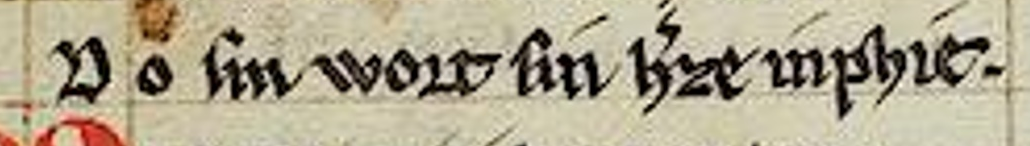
Do ſin wort ſin h(er)ze inphie.
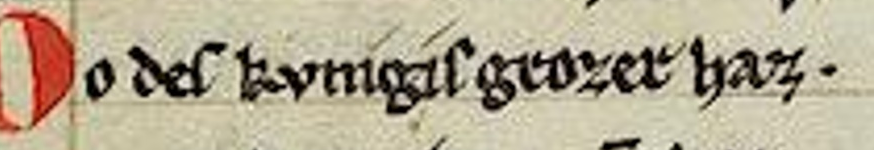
*Do deſ kvnigiſ grozer haz.
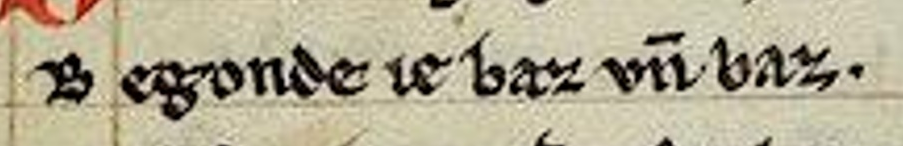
Begonde ie baz vn(d) baz.
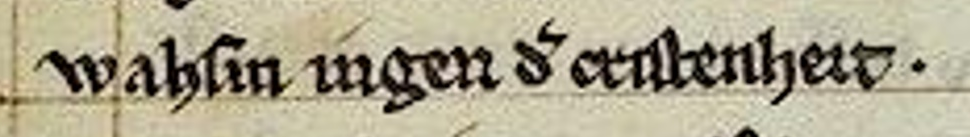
Wahſin ingen d(er) criſtenheit.
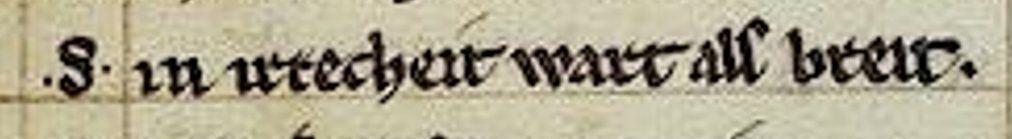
Sin irrecheit wart alſ breit.
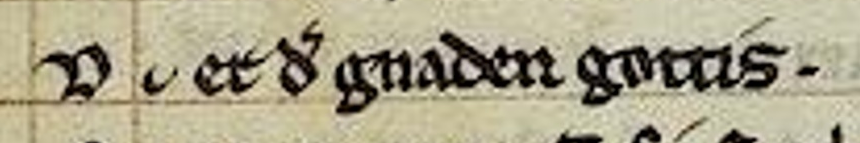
D(az) er d(er) gnaden gottis.
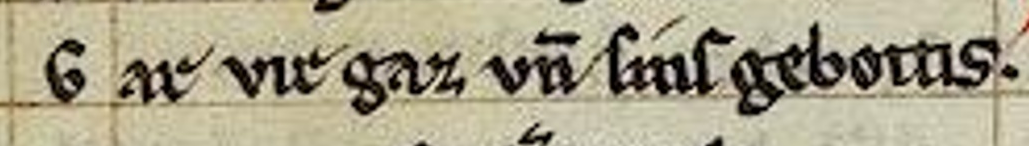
Gar vir gaz vn(d) ſinſ gebottis.
